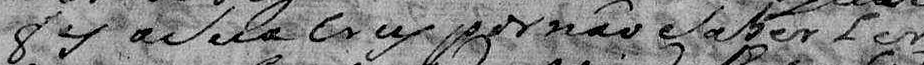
fes a sua crus por não saber Ler
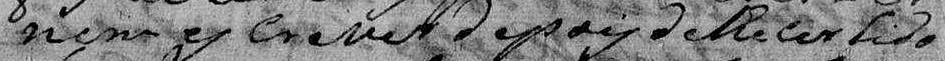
nem escrever depois de lhe cer lido
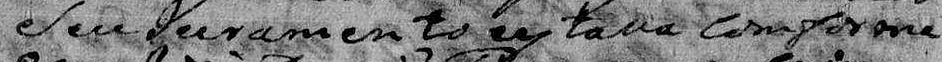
seu Iuramento e estava comforme
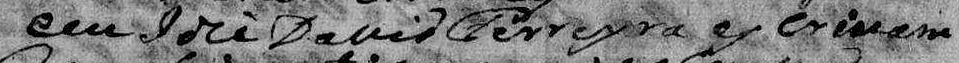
e eu Ioze David Ferreyra escrivam
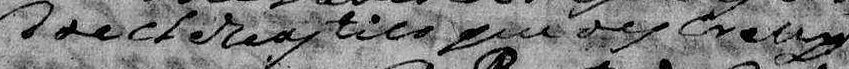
do ecleziastico que o escreuy
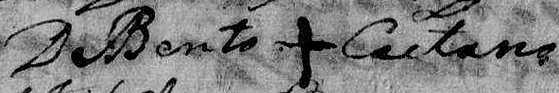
De Bento + Caetano
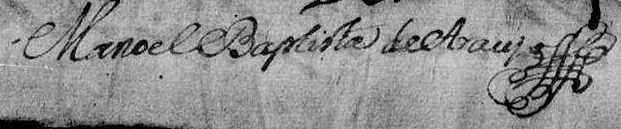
Manoel Baptista de Araujo
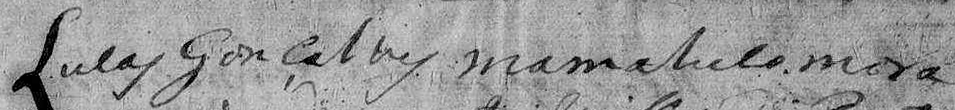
Lucas Gonçalves mamaluco mora
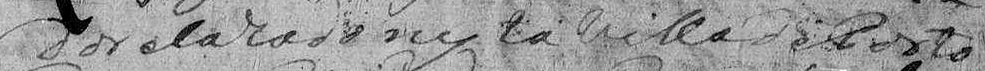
dor e cazado nesta villa de Porto
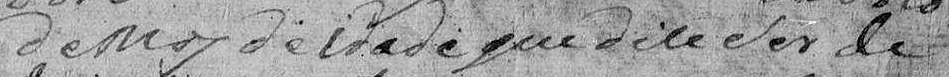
de Mos de idade que dice ser de
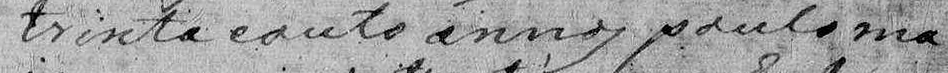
trinta e outo annos pouCo ma
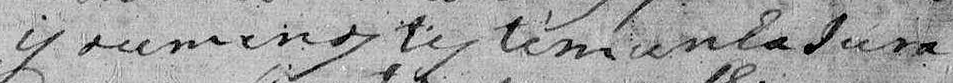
is ou menos testemunha Iura
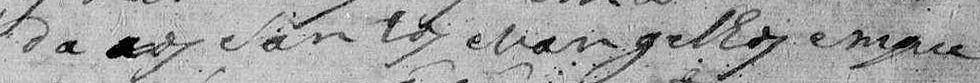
da aos santos evangelhos em que
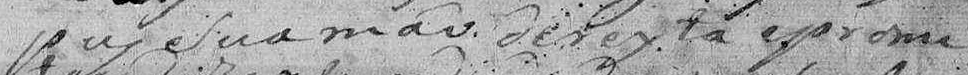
pus sua maõ direyta e prome
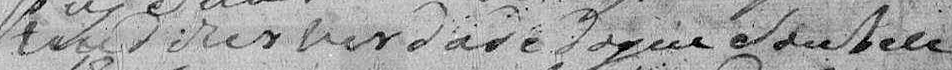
teu dizer verdade do que Soubece
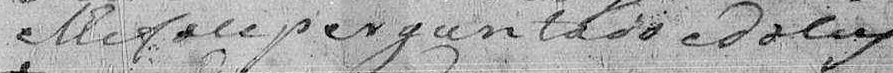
e lhe foce perguntado e do cus
